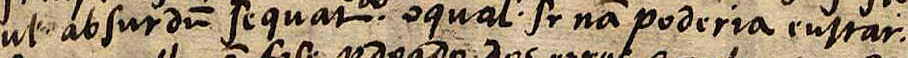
ul absurdū sequatur o qual. se nā poderia eujtar.
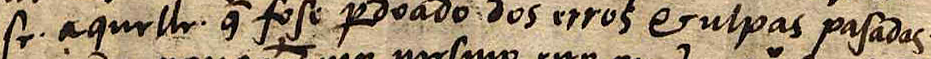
se. aquelle. q̄ fose ꝑdoado dos erros e culpas pasadas.
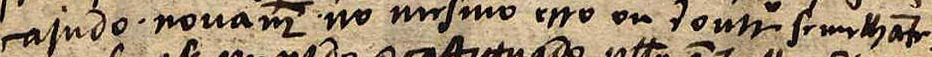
cajndo. nouamte. no mesmo erro ou ē outro semelhāte
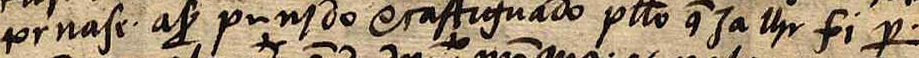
tornase. as ꞩ punjdo e castiguado pl̄lo q̄ Ja lhe foi ꝑ.
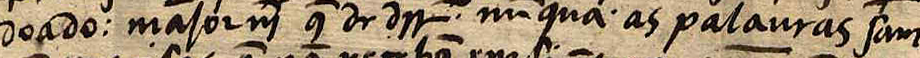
doado: majormte q̄ de drrto. nūqua. as palauras sam
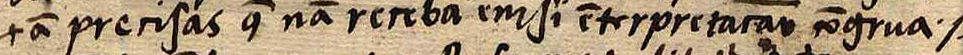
tā precisas q̄ nā recebā em si ēterpretação cōgrua./.
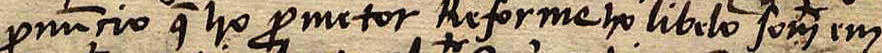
ꝓnūçio q̄ ho ꝓmetor Reforme ho libelo somte em
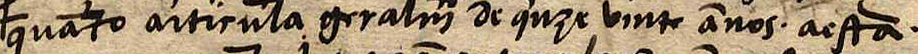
quāto articula geralmte de qinze vinte ānos. a esta.
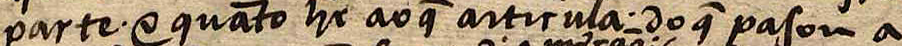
parte. e quāto he ao q̄ articula. do q̄ pasou a
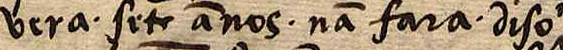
vera. sete ānos. nā fara. diso
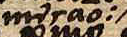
mēcão:/
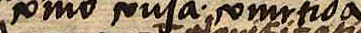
como cousa. cometida
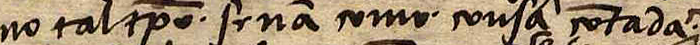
no tal tp̄o. senā como. cousa c̄otada
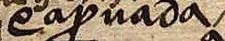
e aꝓuada/.
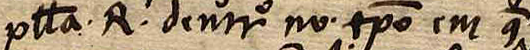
pl̄la. R. dentro no. tp̄o em q̄
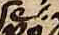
se/.
